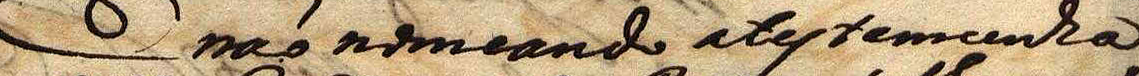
E naõ nomeando a testemunha
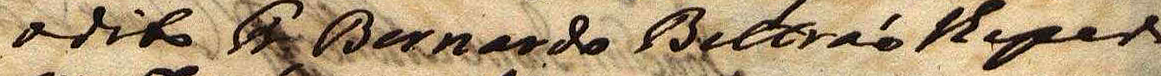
o dito Fr. Bernardo Beltraõ lhe per
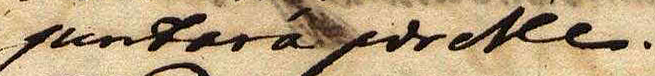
guntará por elle.
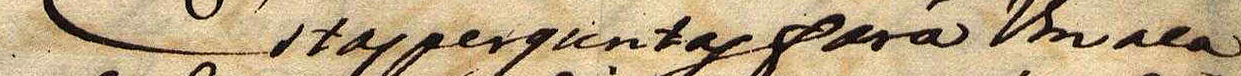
Estas perguntas fará Vm a ca
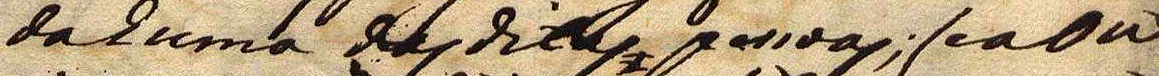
da huma das ditas, pessoas; (e a Ou
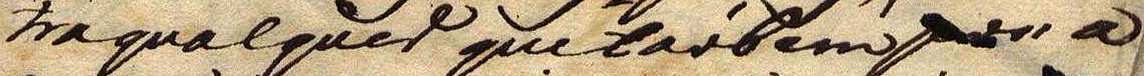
tra qualquer que taõbem possa
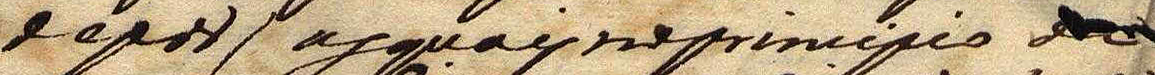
depor) as quais no principio d
